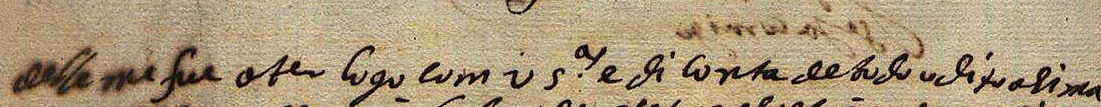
della me fue a ter logo com v s.as e di conta de todo o dito asima
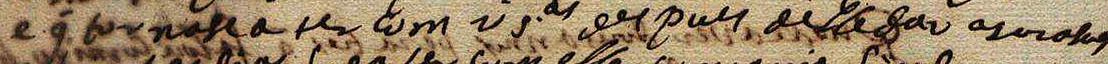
e q̄ tornase a ter com v s.as despues de lle dar as orasoes
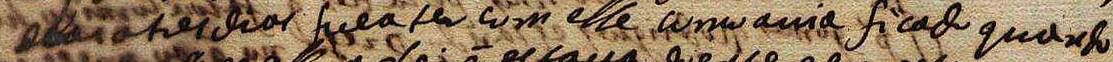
de ai a tres dias fue a ter com elle como auia ficado quando
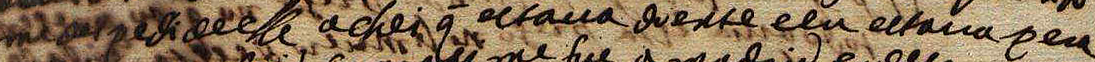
me despedi de elle achei q̄ estaua doente e eu estaua pera
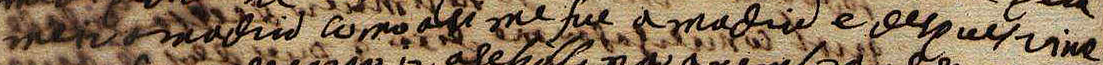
me ir a madrid como asi me fue a madrid e despues vine
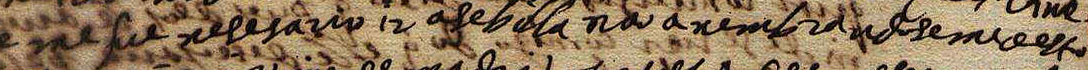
e me fue nesesario ir a sebilla nā anembrandoseme desto
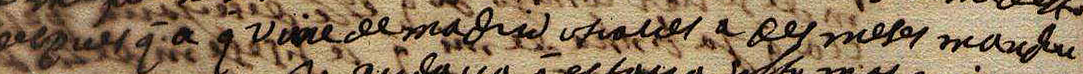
despues q̄ a q̄ vine de madrid otra ues a des meses mandou
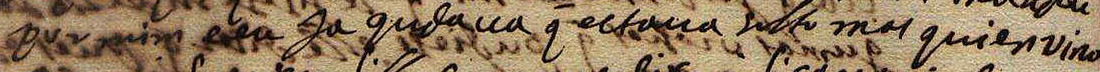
por mim e eu Ja qudaua q̄ estaua solto mas quien vino
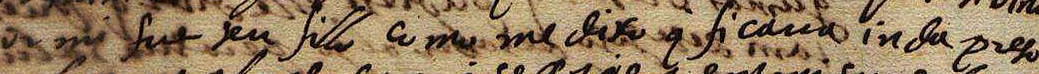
por mi fue seu fillo como me dixo q̄ ficaua inda preso
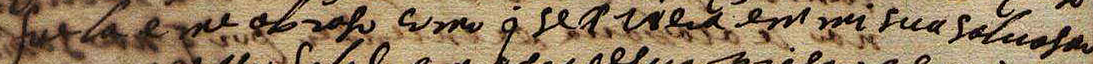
fue la e me abraso como q̄ se tivera em mi sua saluasao
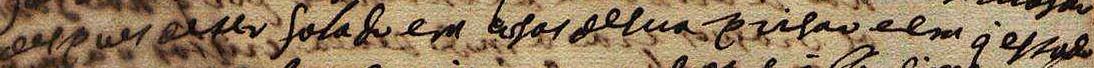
despues de ter falado em cosas de sua prisao e em q̄ estado
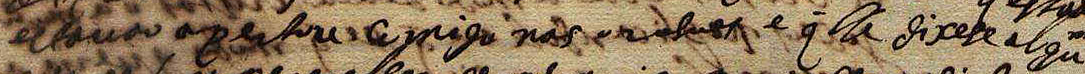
estauao apertou comigo nas orasoes e q̄ lhe dixese alguma
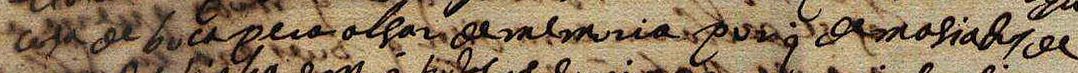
cosa de boca pera olhar de memoria porq̄ demasiados de
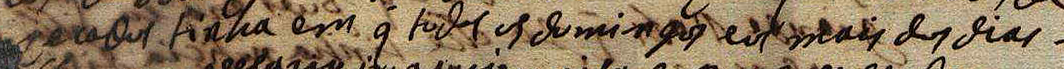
pecados tinha em q̄ todos os domingos e os mais dos dias
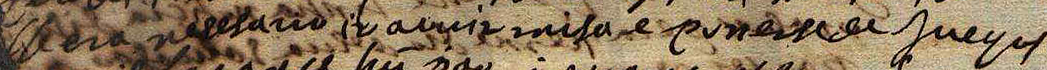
lle era nesesario ir ouuir misa e ponerse de Jueijos
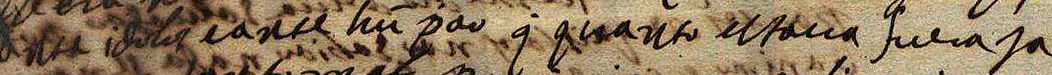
ante idolos e ante hū pao q̄ quanto estaua fuera Ja
